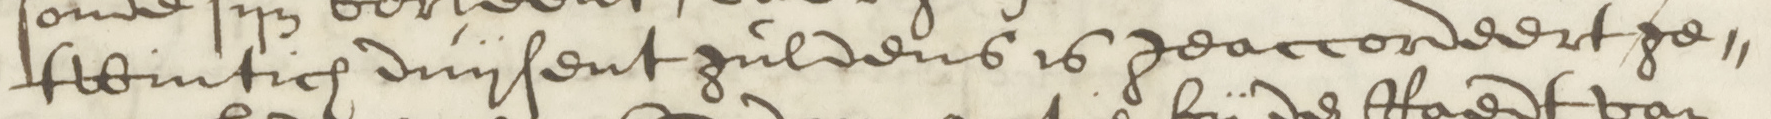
twintich duijsen guldens is geaccordeert ge„
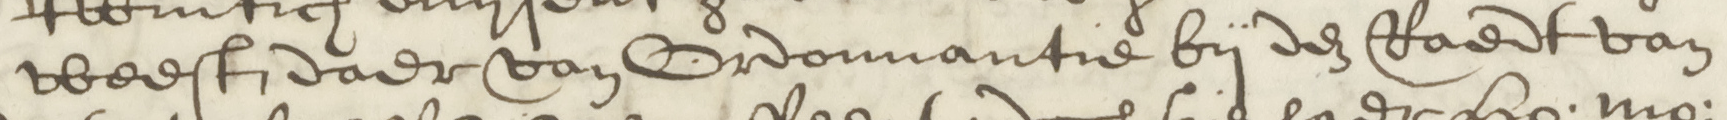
weest, daer van Ordonnantie bij den Raedt van
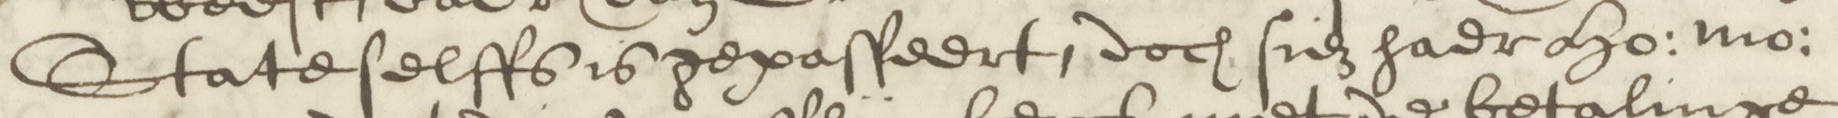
State selffs is gepasseert, doch sien haer Ho:Mo:
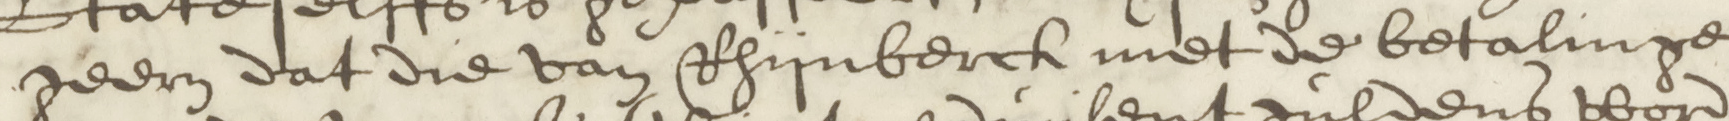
geern dat die van Rhijnberck met de betalinge
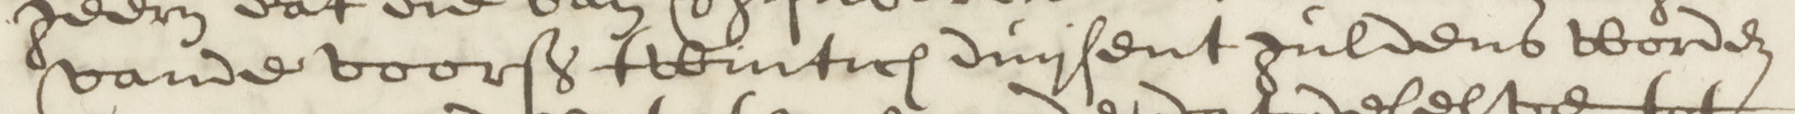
vande voorsz twintich duijsent guldens worden
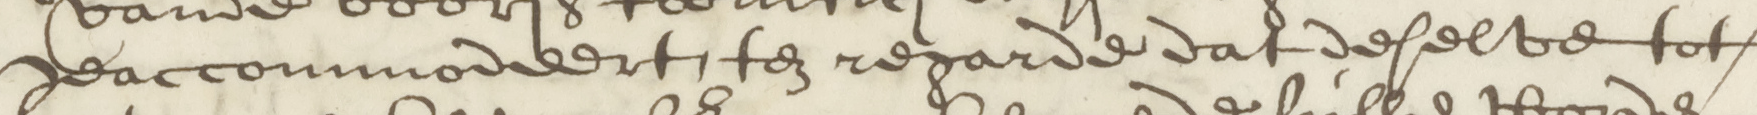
geaccommodeert, ten regarde dat deselve tot
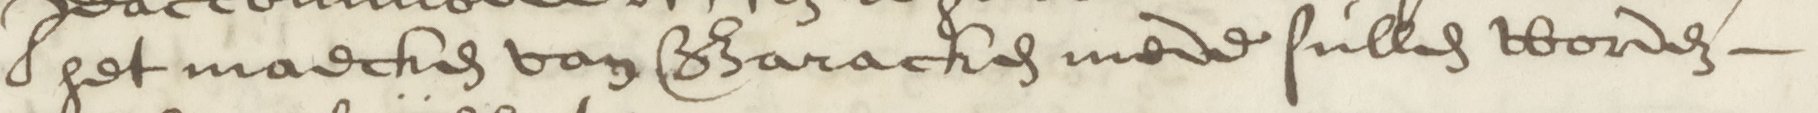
het maecken van Baracken mede sullen worden ¬
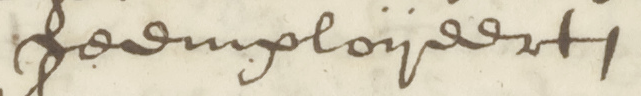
geemploijeert.
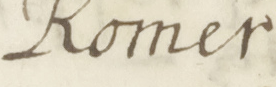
Romer
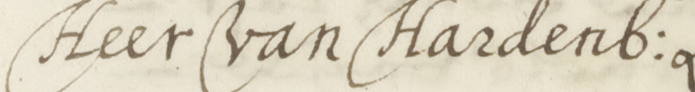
Heer van Hardenb:
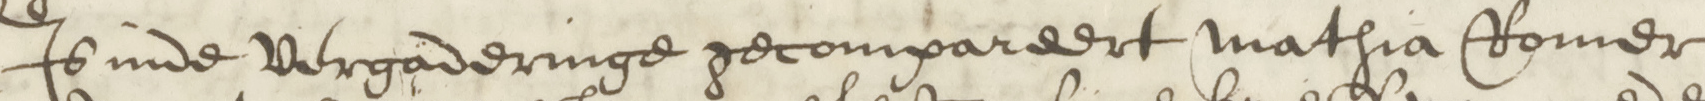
Is inde vergaderinge gecompareert Mathia Romer
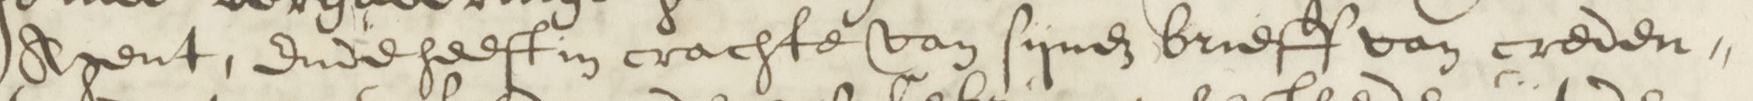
Agent, Ende heeft in crachte van sijnen brieff van creden„
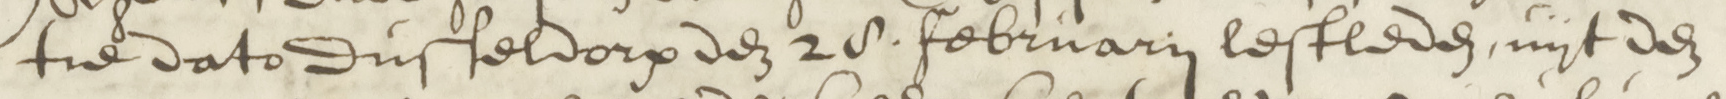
tie dato Dusseldorp den 28. februari lestleden, uijt den
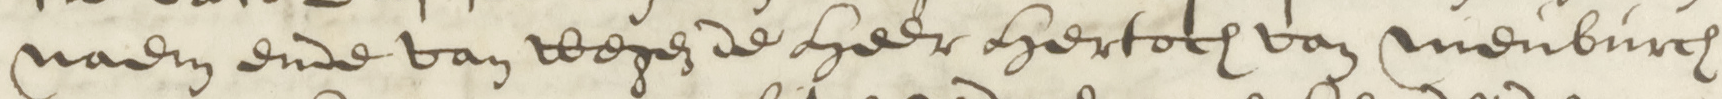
naem ende van wegen de heer hertoch van Meuburch
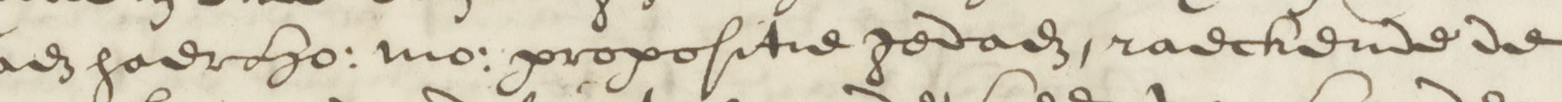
aen haer Ho:Mo: propositie gedaen, raeckende de
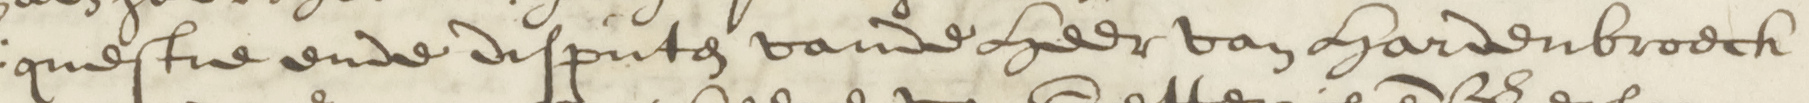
questie ende disputen vande heer van Hardenbroeck
